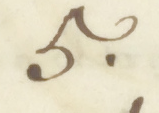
5.
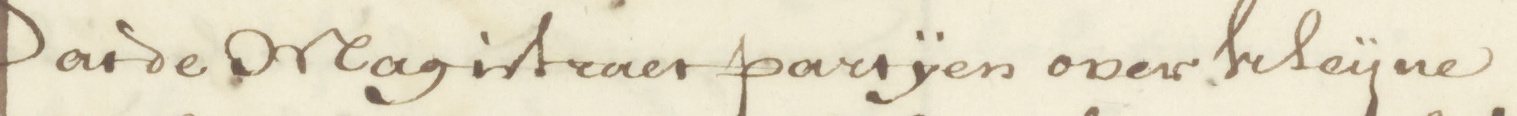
Dat de Magistraet partijen over kleijne
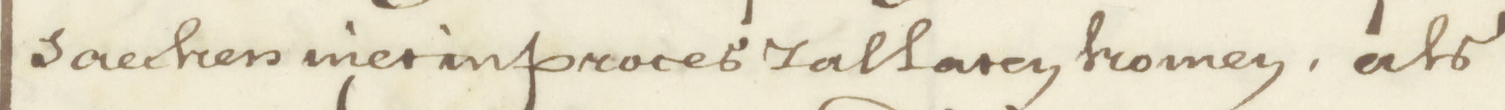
saecken niet in proces zal laten komen, als
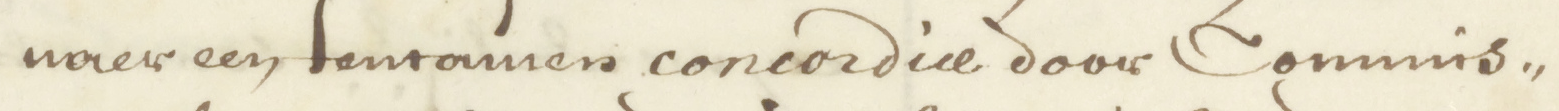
naer een tentamen concordiæ door Commis„
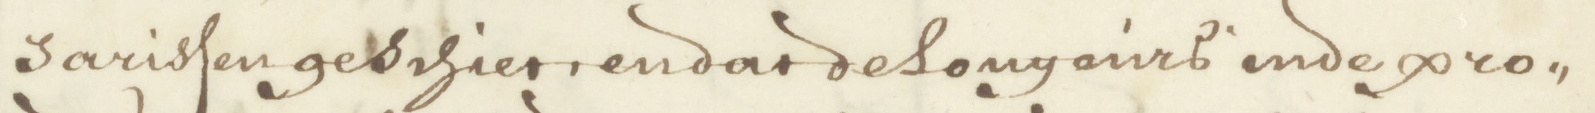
sarissen geschiet, en dat de longeurs inde pro„
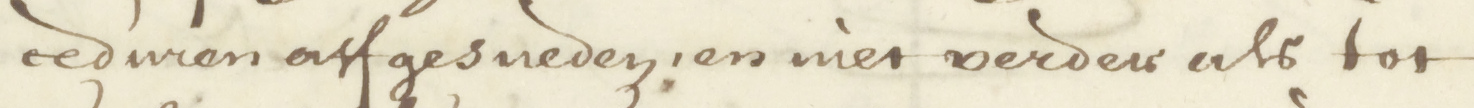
ceduren affgesneden, en niet verder als tot
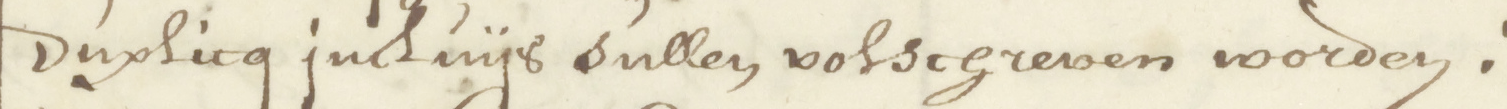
duplicq incluijs sullen volschreven worden:
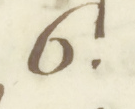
6.
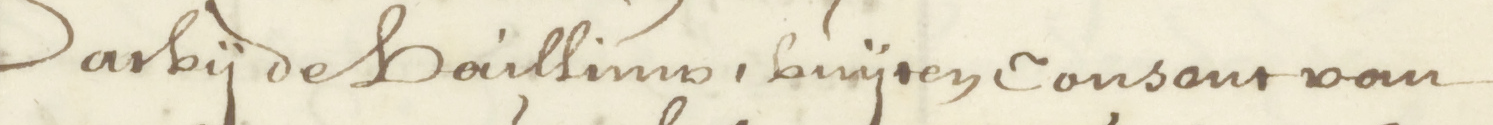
Dat bij de Bailliuw, buijten consent van
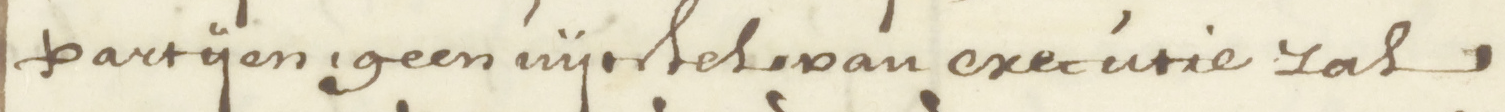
partijen, geen uijtstel van executie zal
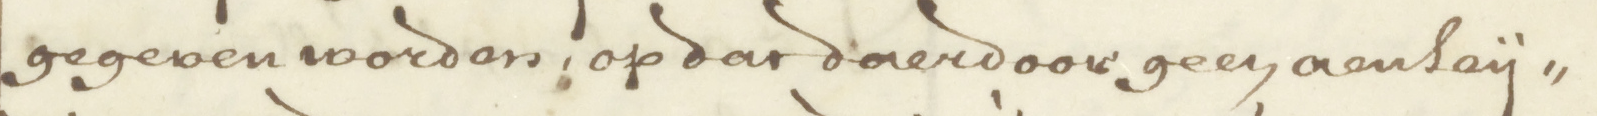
gegeven worden, op dat daerdoor geen aenleij„
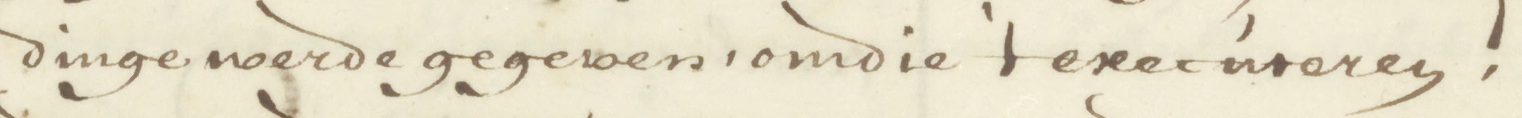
dinge werde gegeven, omdie ‛t executeren,
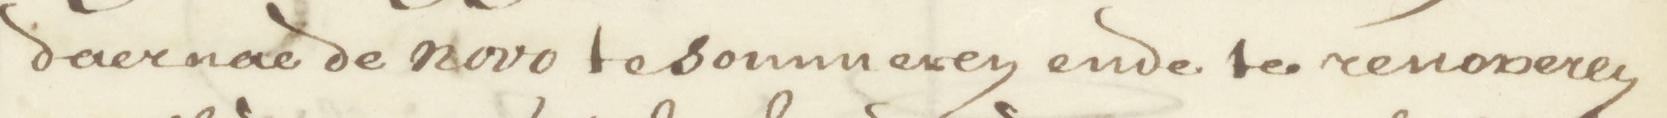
daernae de novo te sommeren ende te renoveren
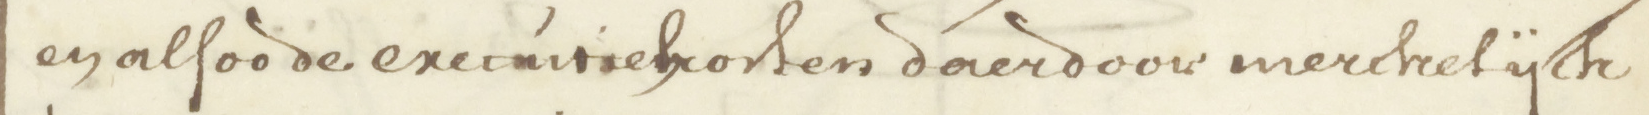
en alsoo de executiekosten daerdoor merckelijck
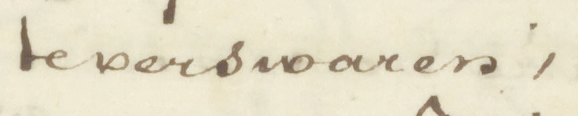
te verswaren,
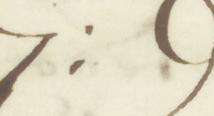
7.
